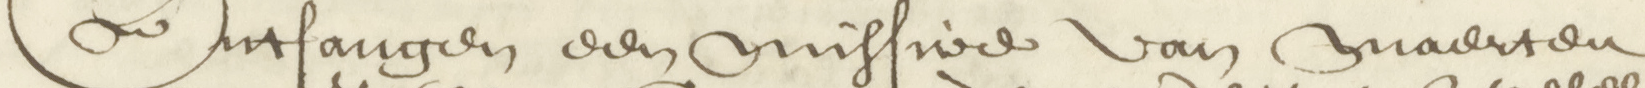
Ontfangen een missive van Maerten
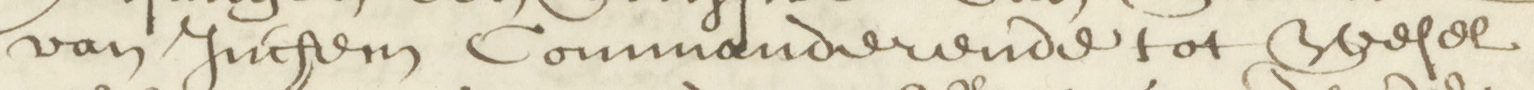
van Juchem Commanderende tot Wesel
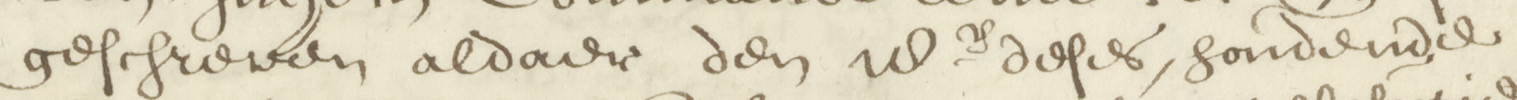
geschreven aldaer den 18e deses, houdende
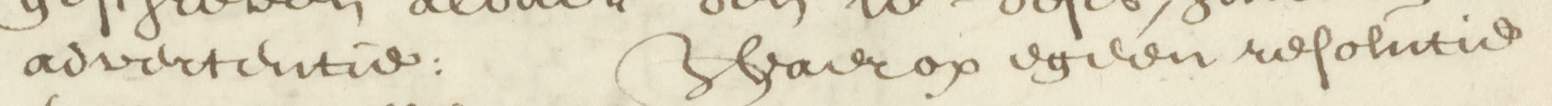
advertentie: Waerop egeen resolutie
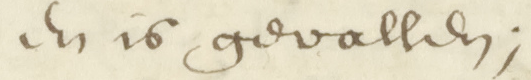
en is gevallen;
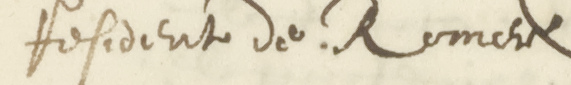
Resident de Romer
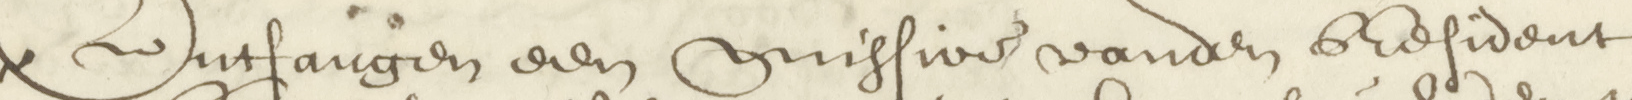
Ontfangen een Missive vanden Resident
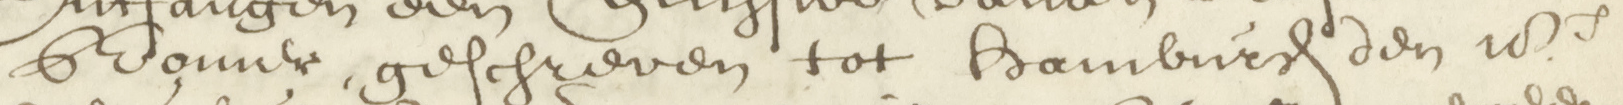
Romer, geschreven tot Hamburch den 18e
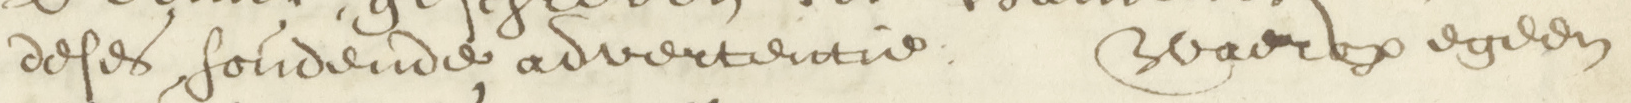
deses, houdende advertentie: Waerop egeen
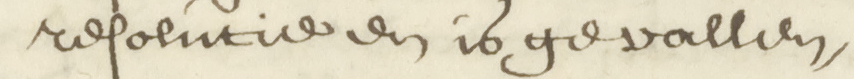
resolutie en is gevallen.
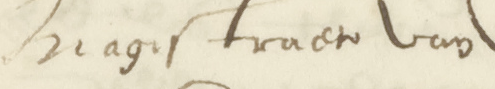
magistraet van
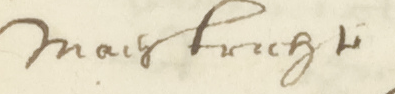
maestricht
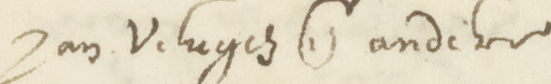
Jan veugen & andere
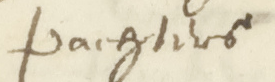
Pachters
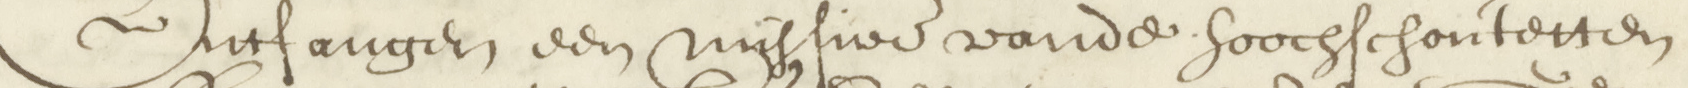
Ontfangen een missive vande hoochschoutett en
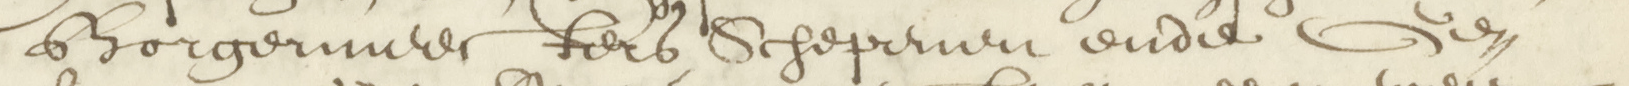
Borgermeesters Schepenen ende Ge,,
